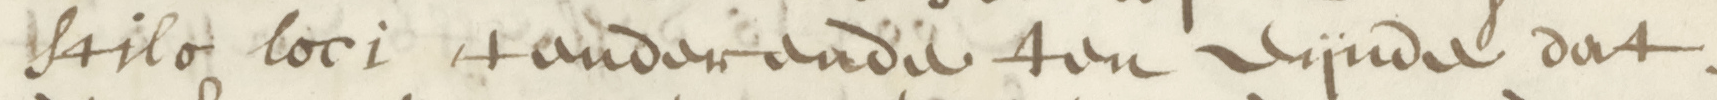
stilo loci, tenderende ten eijnde dat
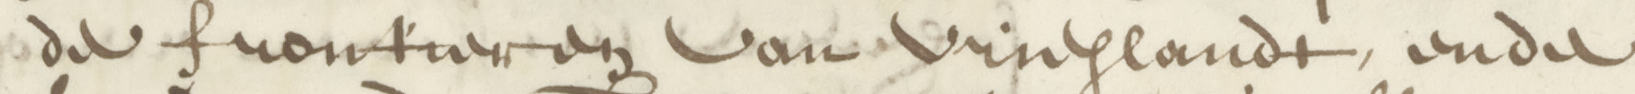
de frontieren van Vrieslandt, ende
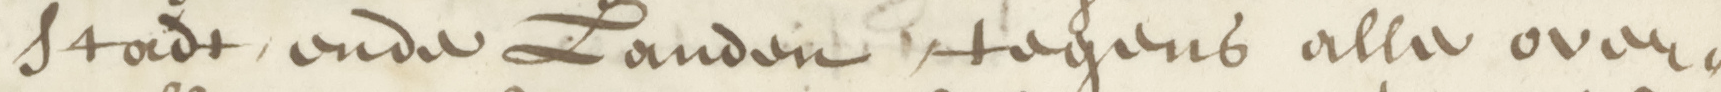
Stadt, ende Landen tegens alle over„
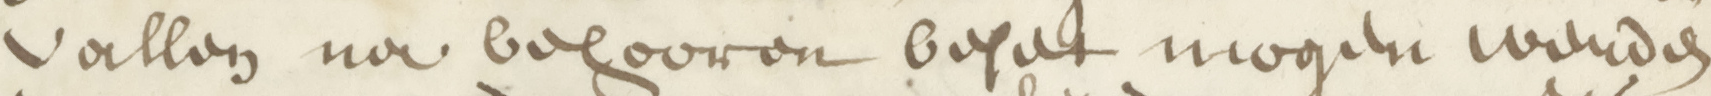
vallen na behooren beset mogen werden
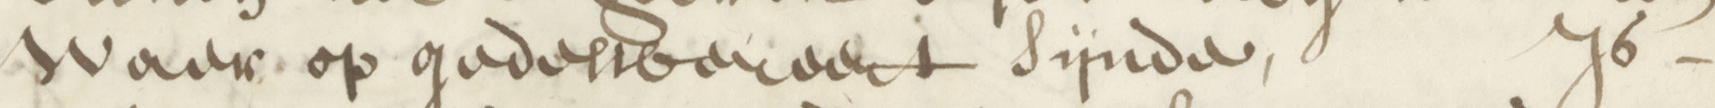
Waer op gedelibereect sijnde, Is —
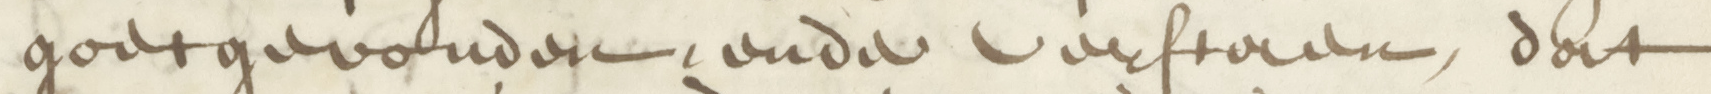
goetgevonden, ende verstaen, dat
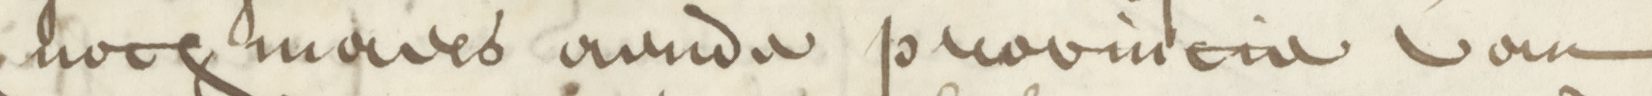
noch maels aende provincie van
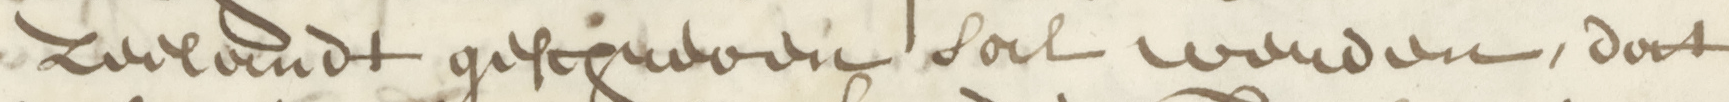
Zeelandt geschreven sal werden, dat
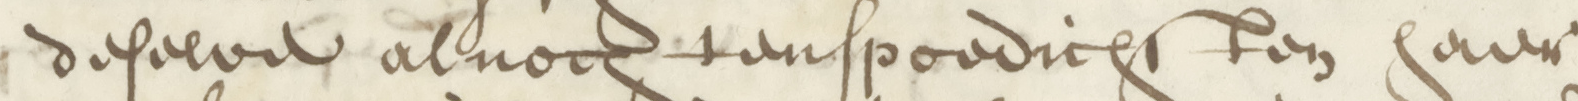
deselve alnoch ten spoedichsten haer
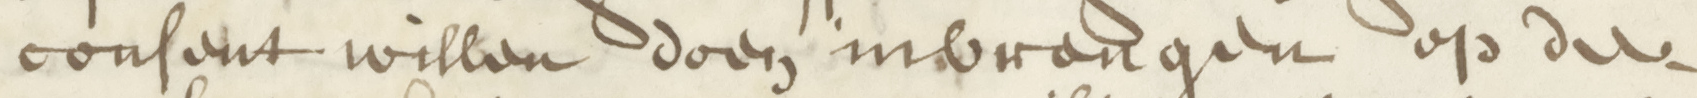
consent willen doen inbrengen op de
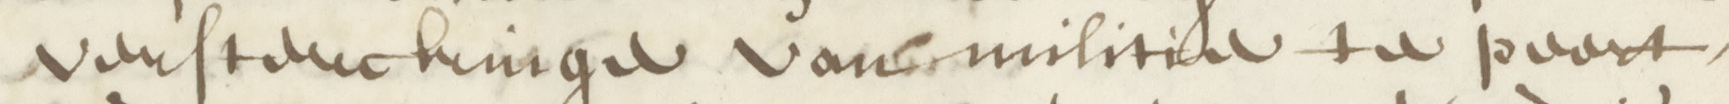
versterckinge van militie te peert,
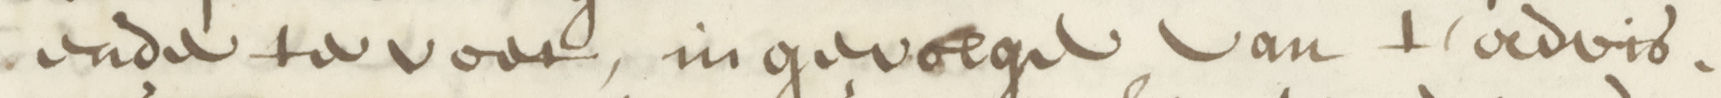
ende te voet, ingevolge van t'advis,
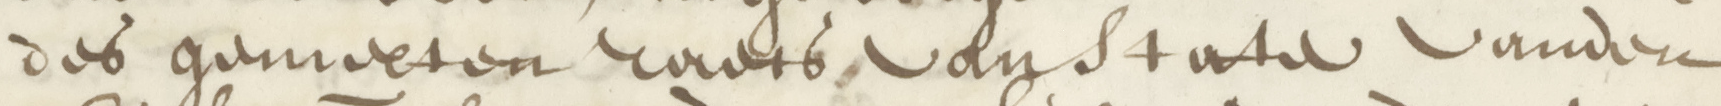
des gemelten raets van State vanden
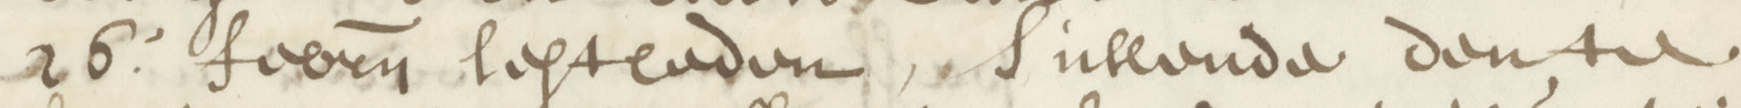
26e. febry lestleden, Sullende den te
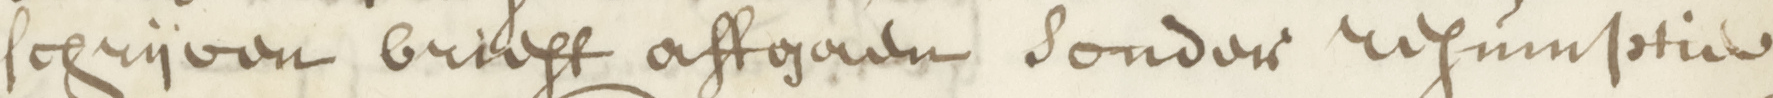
schrijven brieff affgaen sonder resumptie.
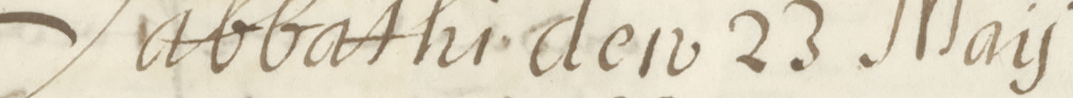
Sabbathi den 23 Maij
